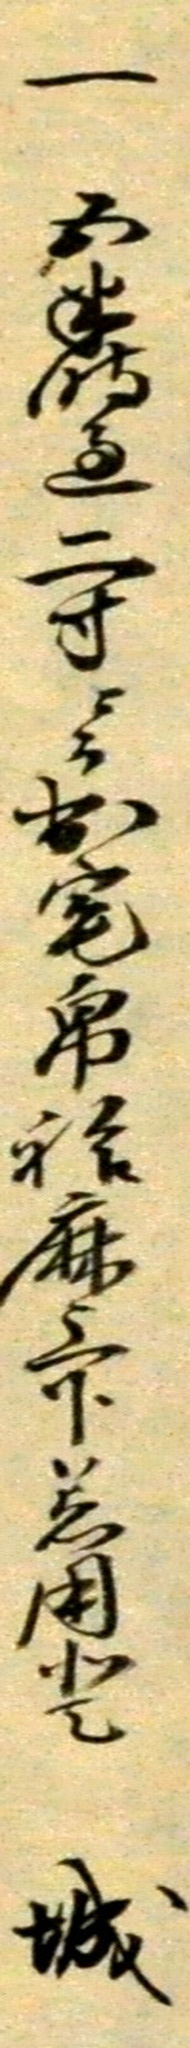一五半時過二寸ニ而出宅綿袷麻上下着用登城
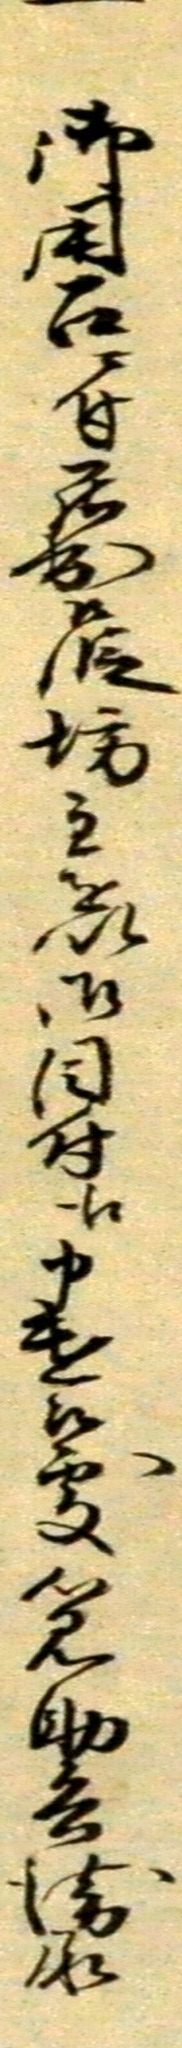一御用召ニ付罷出候段坊主を以御目付江申遣候処筧助兵衛承
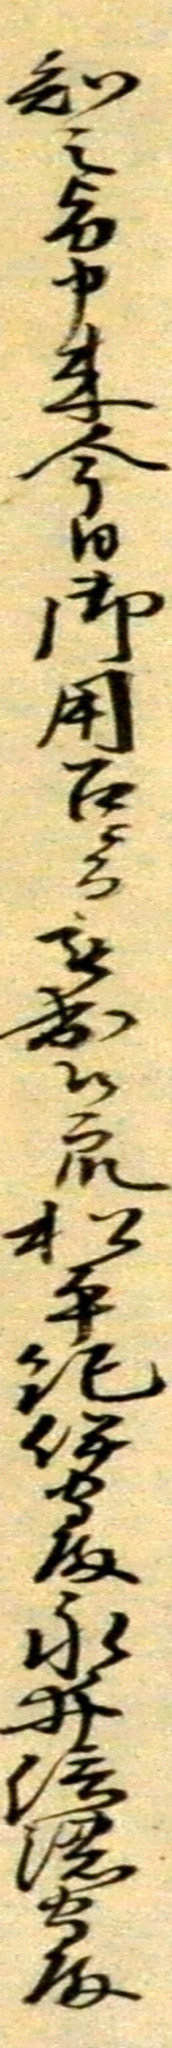知之旨申来今日御用召ニ而罷出候衆松平紀伊守殿永井信濃守殿
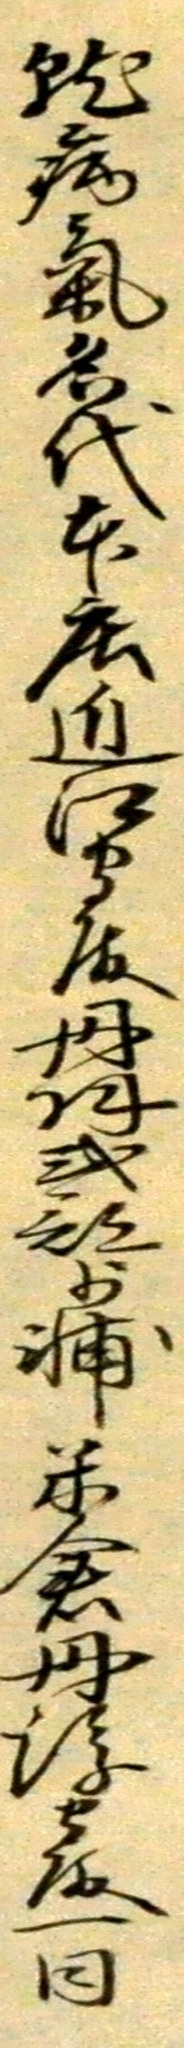就病気名代本庄近江守殿丹羽式部少輔米倉丹後守殿一同
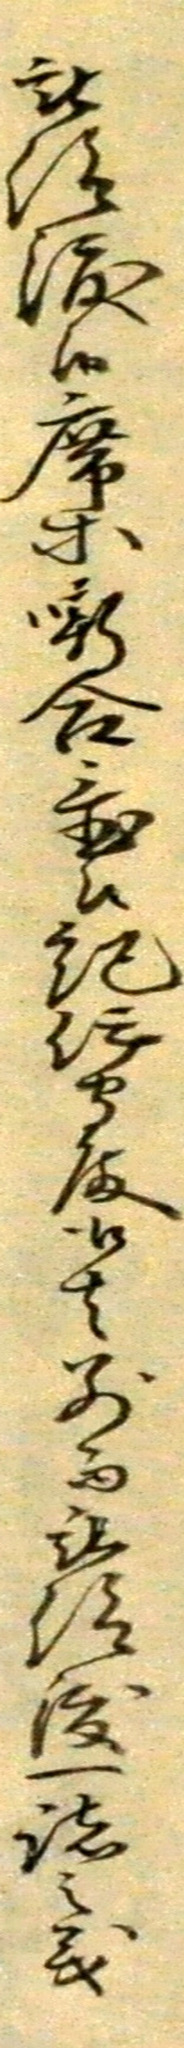被仰渡候席等噺合置候紀伊守殿江者別而被仰渡一諸之義
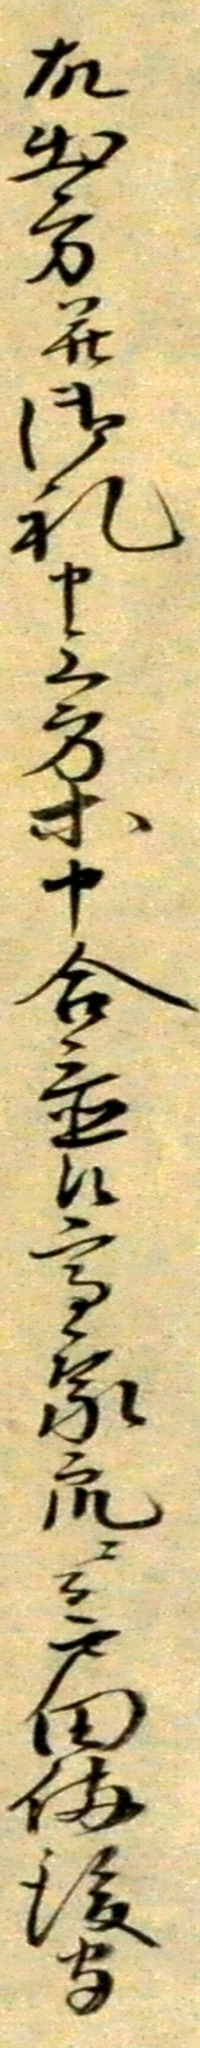故出方幷御礼申上方等申合置候高家衆ニ而戸田備後守
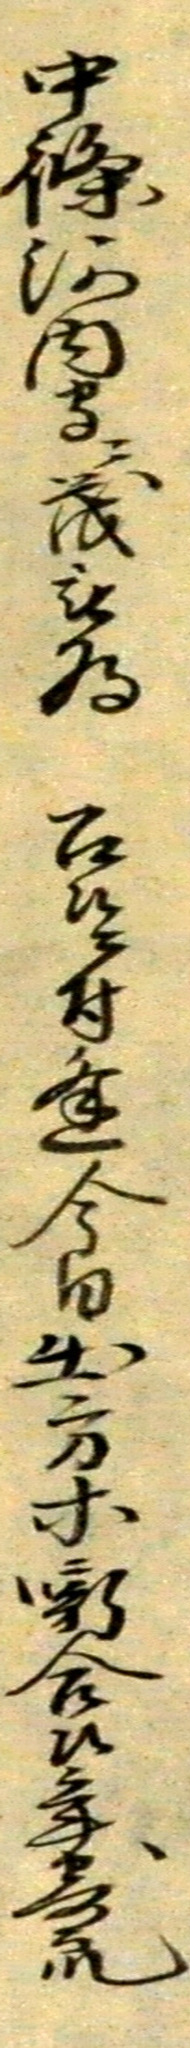中條河内守ニも被為召候ニ付逢今日出方等噺合候年寄衆
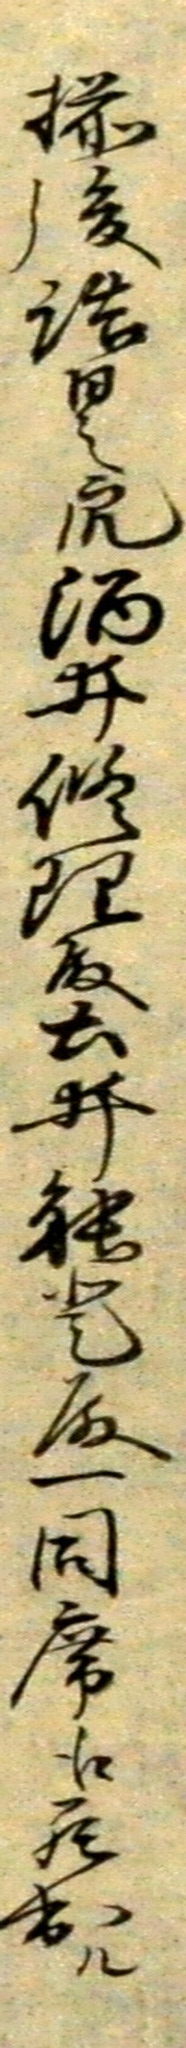揃後詰日之衆酒井修理殿土井能登殿一同席江罷出ル
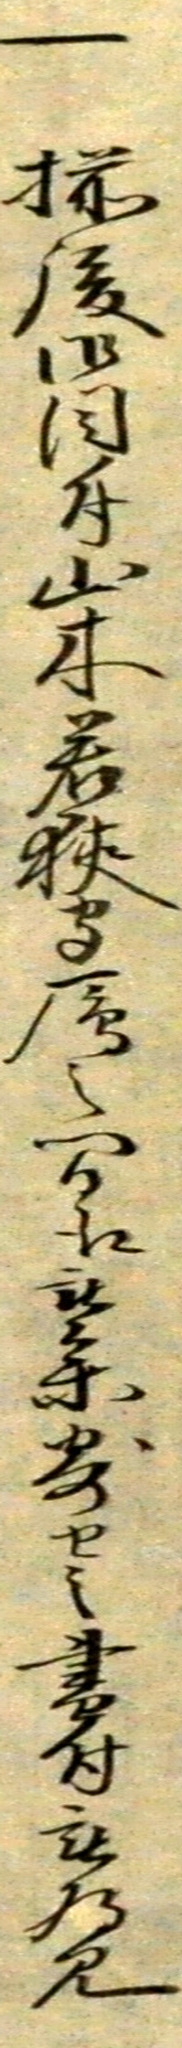一揃後御目付山木若狭守雁之間江被参寄セ之書付被為見
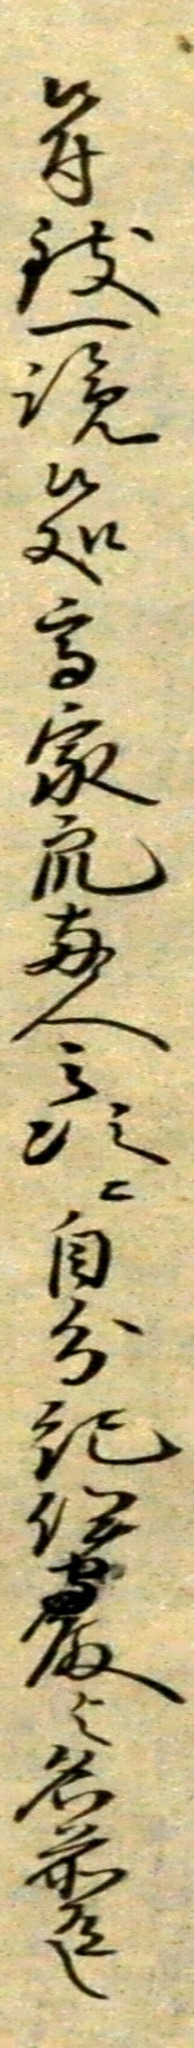候付致一覧候処高家衆両人之次ニ自分紀伊守殿と名前有之
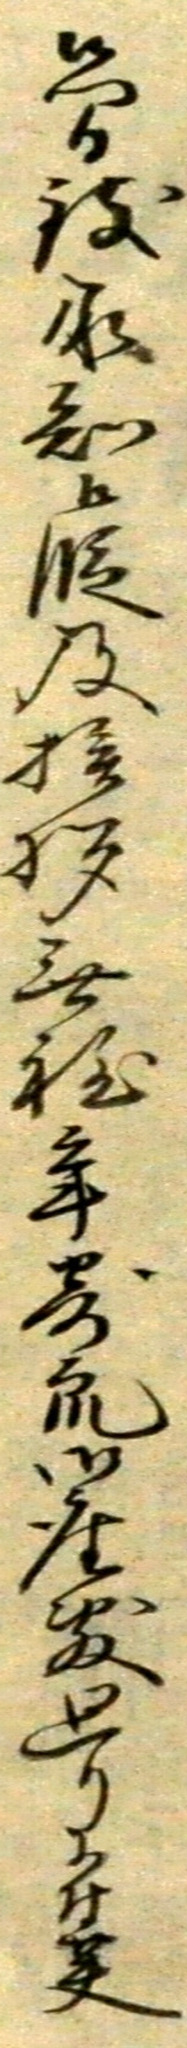候間致承知候段及挨拶無程年寄衆御座敷廻りに付芙
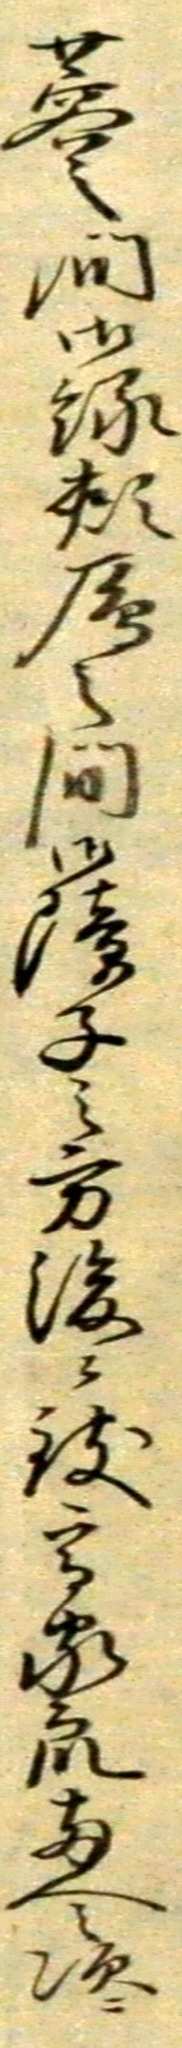蓉之間御縁頬雁之間御障子之方後ニ致高家衆両人之次ニ
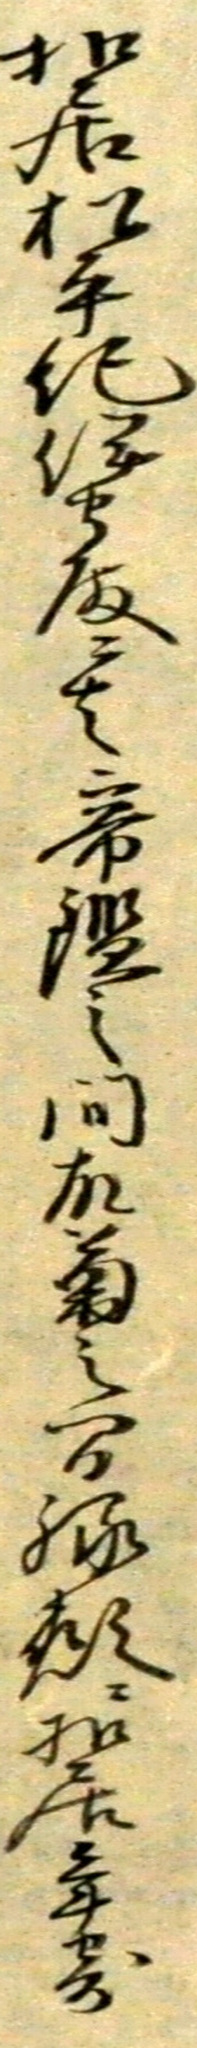扣居松平紀伊守殿ニ者帝鑑之間故菊之間縁頬ニ扣居年寄
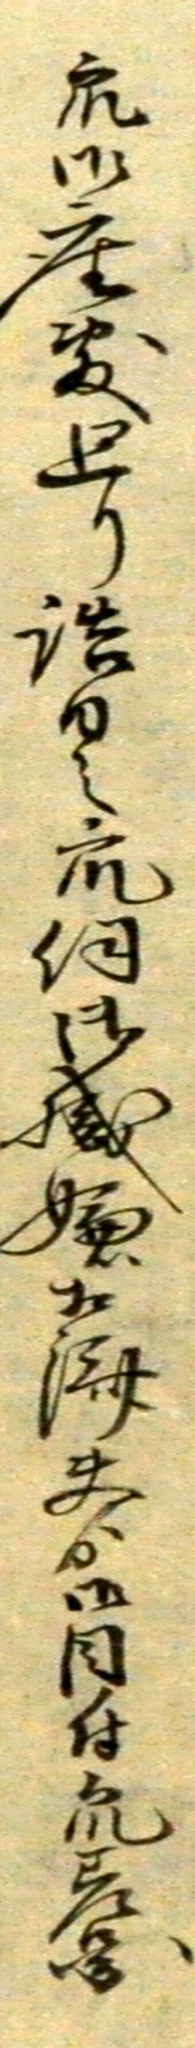衆御座敷廻り詰日之衆伺御機嫌相済夫ゟ御目付衆差図
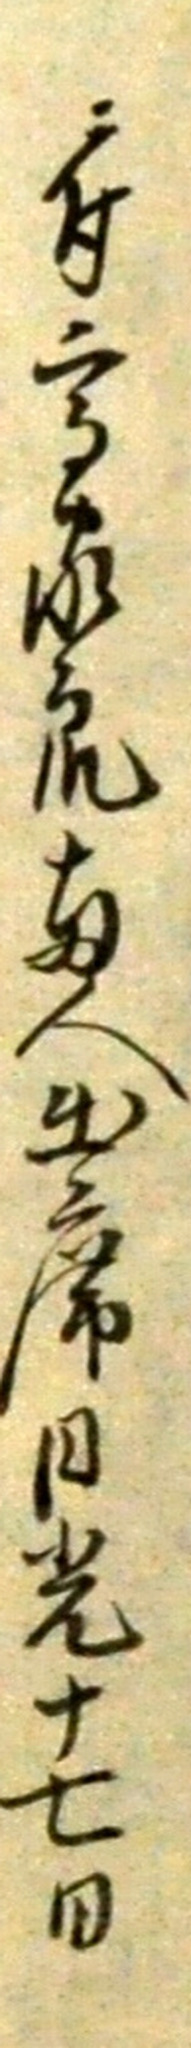ニ付高家衆両人出席日光十七日
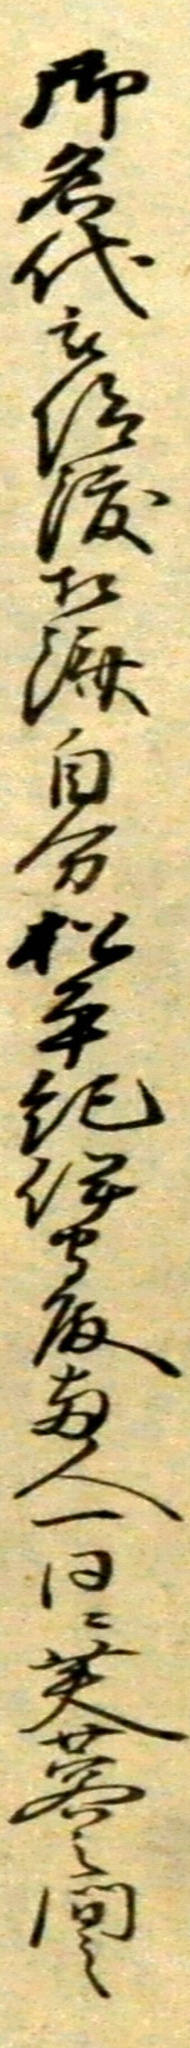御名代被仰渡相済自分松平紀伊守殿両人一同ニ芙蓉之間之
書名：日光御名代相勤候節ノ留
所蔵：伊那市立高遠町図書館・合同会社AMANE
